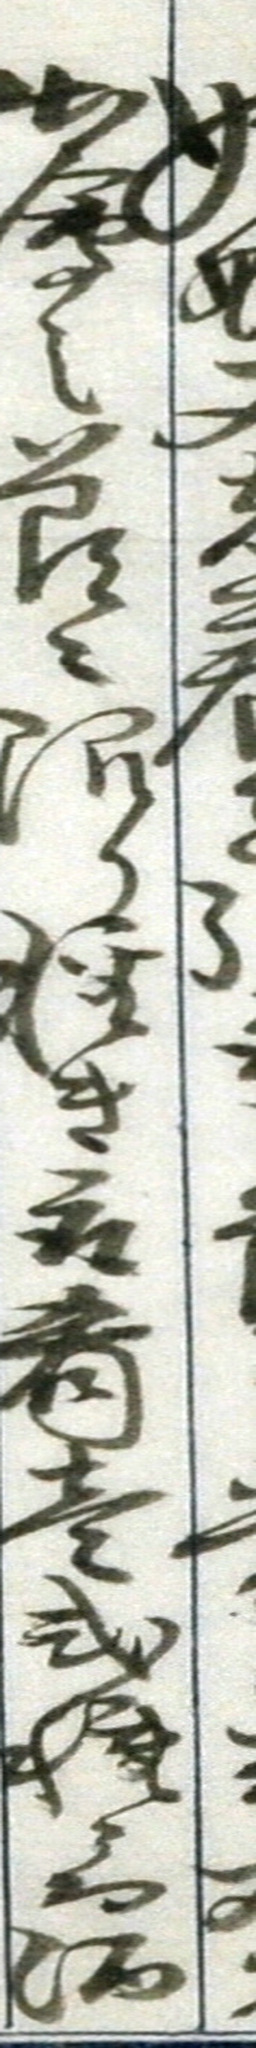出会之節ニ限り軽き取肴壱弐種ニ而酒
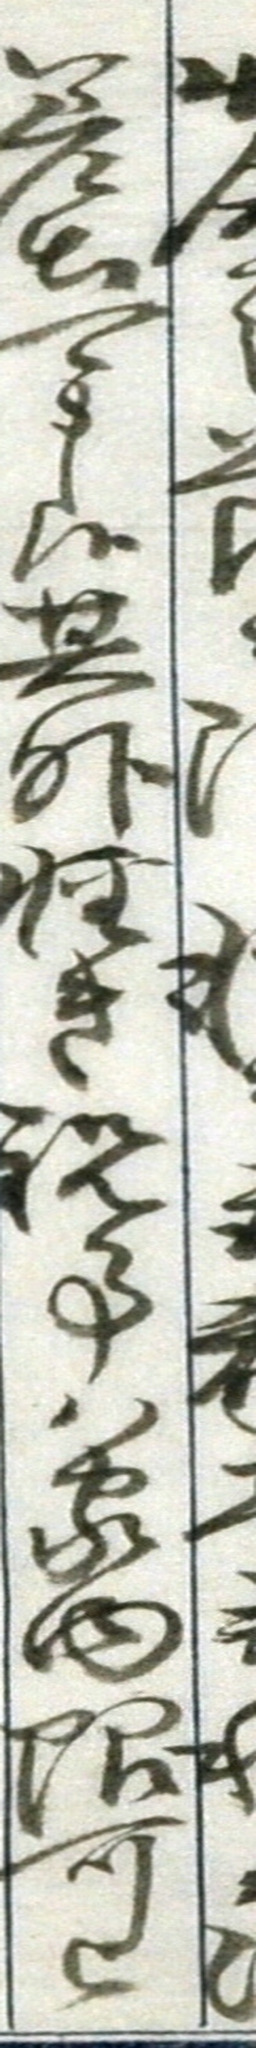差出可申候其外軽き祝事ハ家内限可被
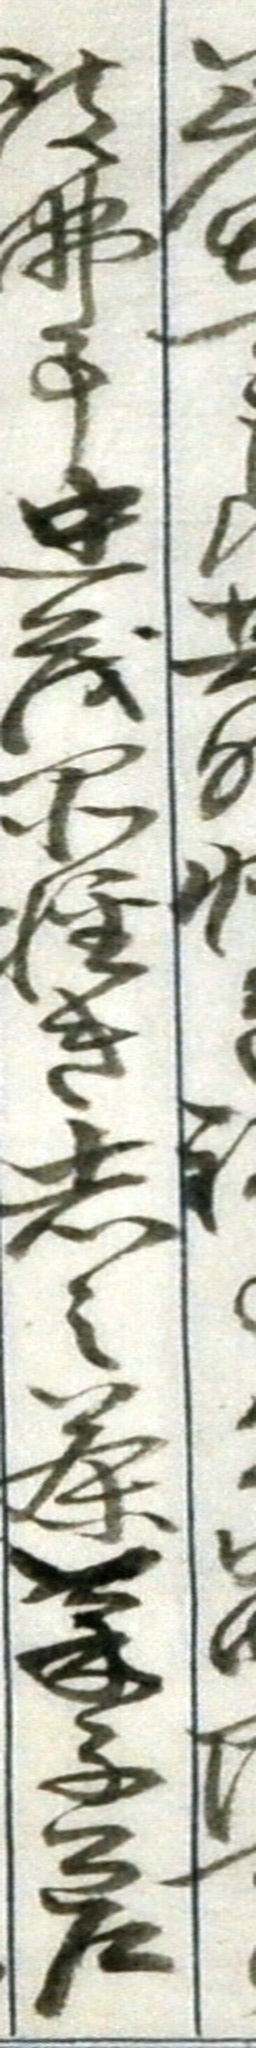致仏事迚も品軽き者之茶菓子差
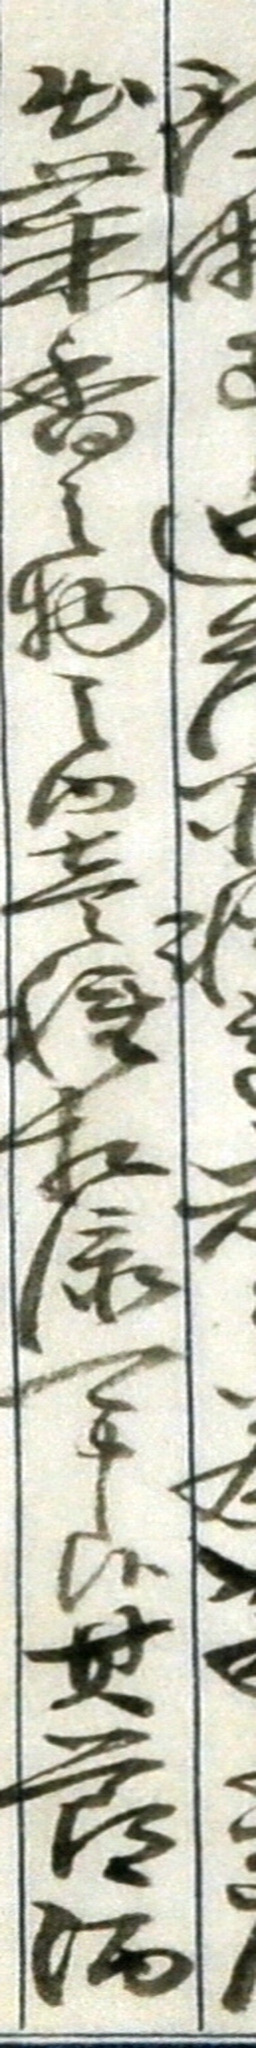出菜香之物之内壱種相添可申候其節酒
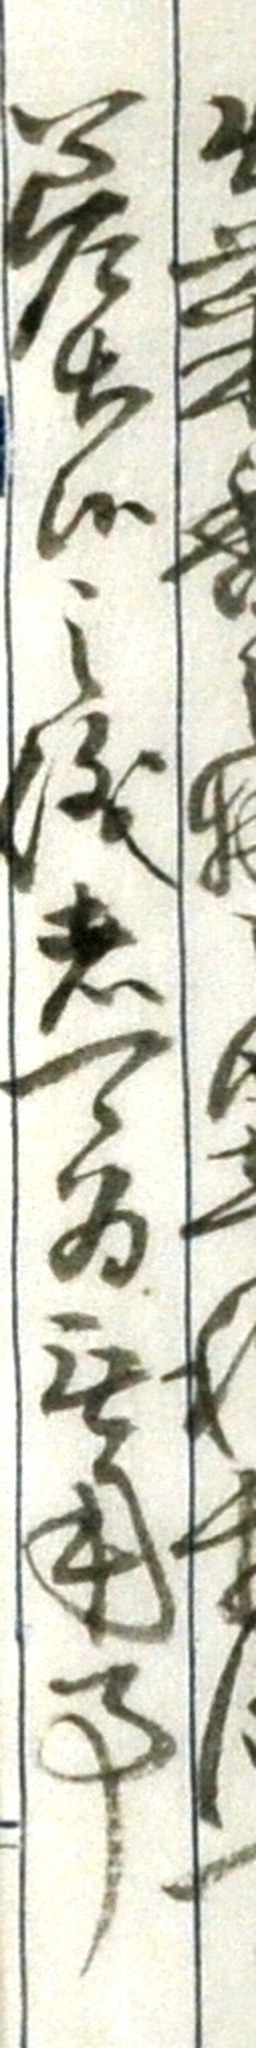差出候之儀は可為無用事

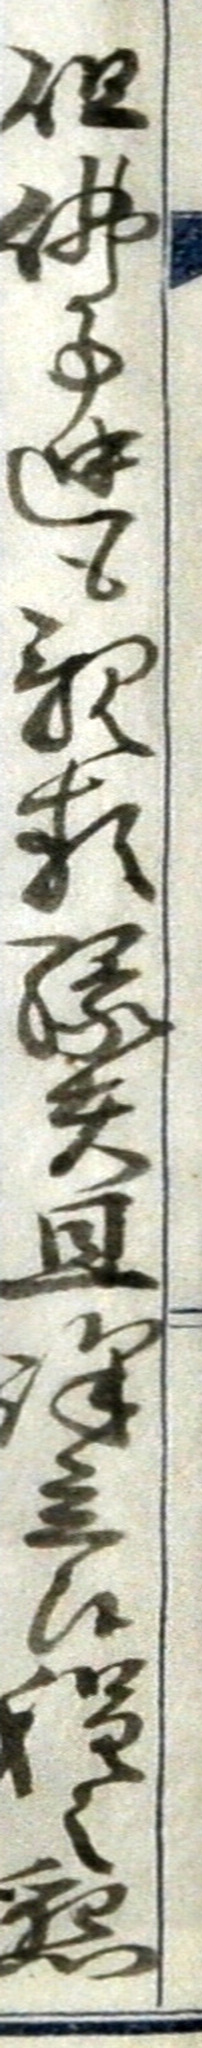但仏事迚も親類縁者且訳立候程之懇
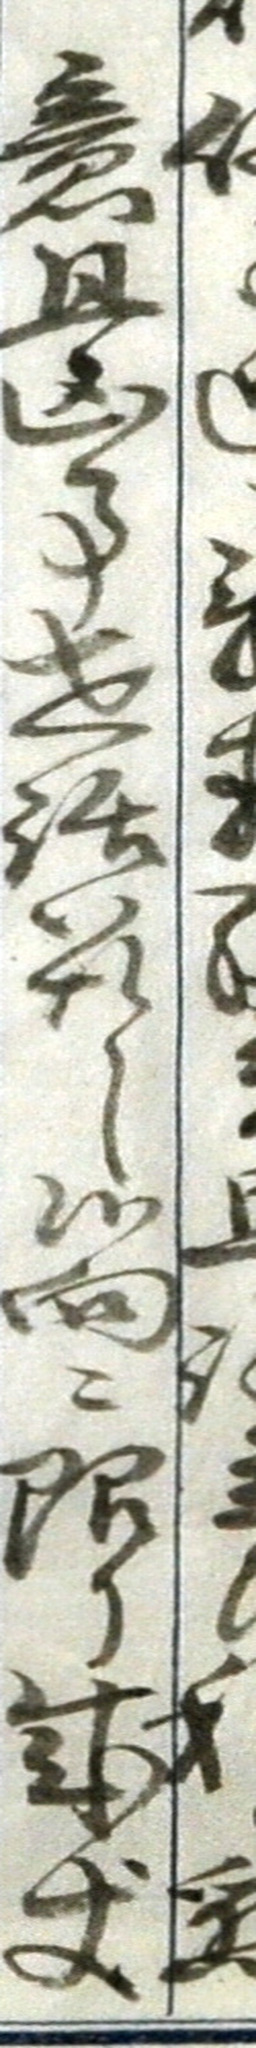意且凶事世話いたし候向ニ限り成丈
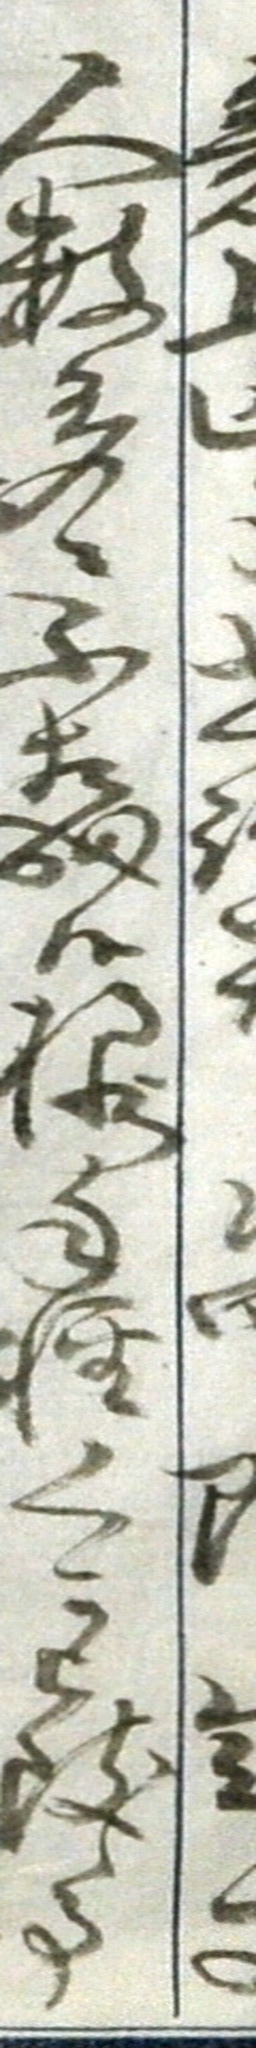人数多ニ不相成候様手軽く可被致候事
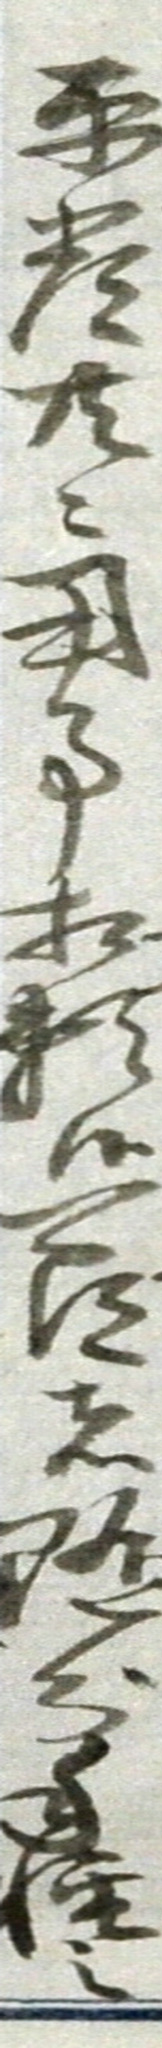平常共ニ用事相頼候節は随分手軽之
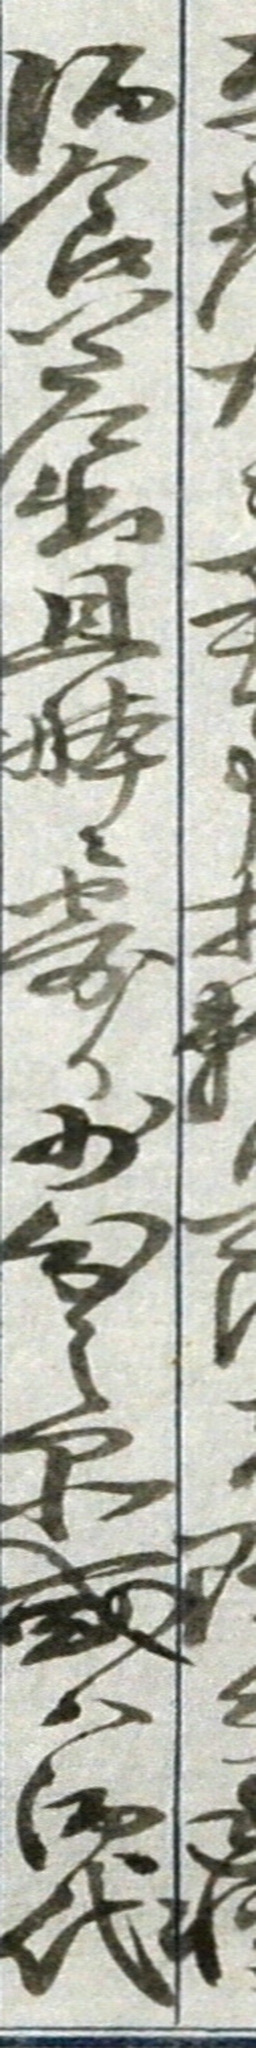酒食差出且躰ニ寄り少分之品或ハ酒代
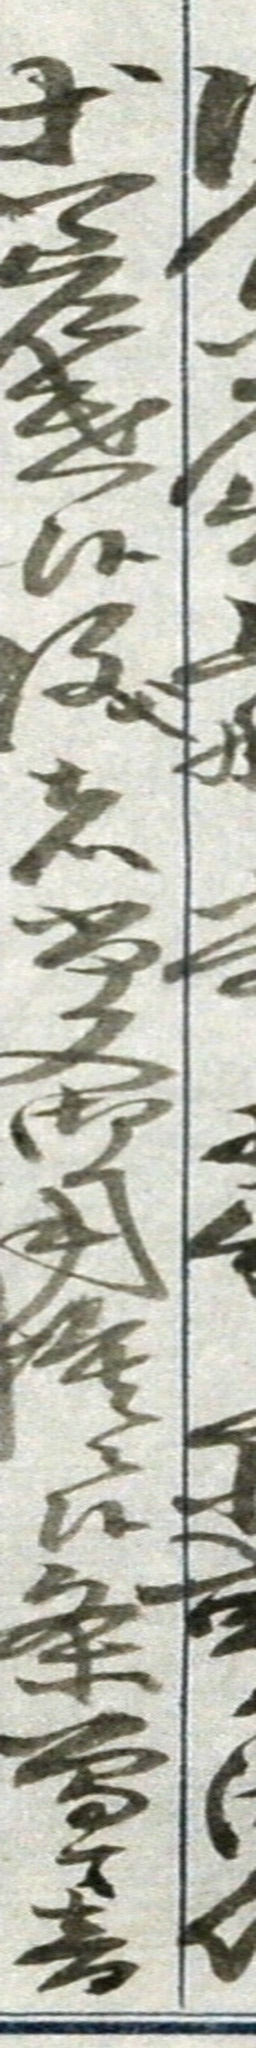等差遣候儀は尚又御用捨ニ候条曽て音
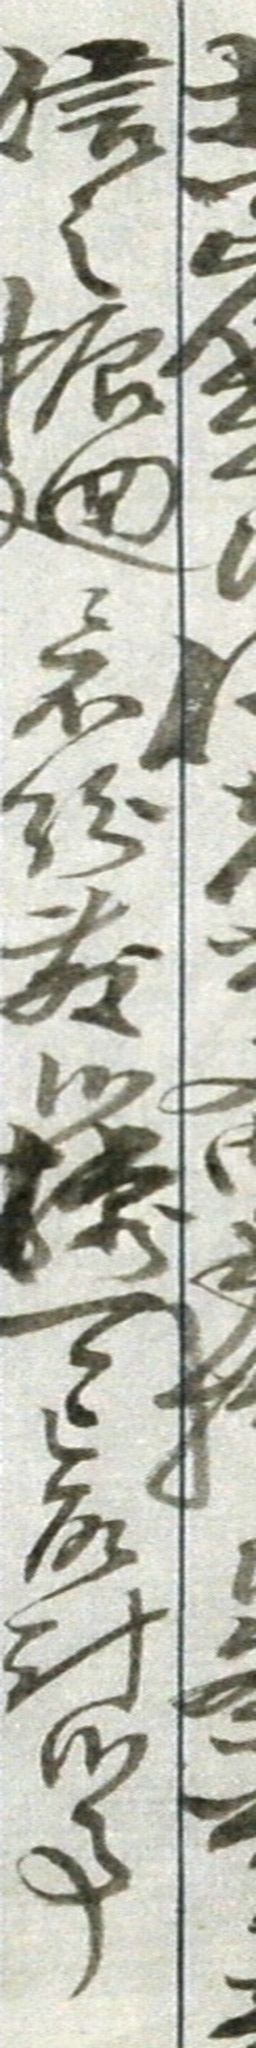信之振廻ニ不紛敷候様可被取計候事
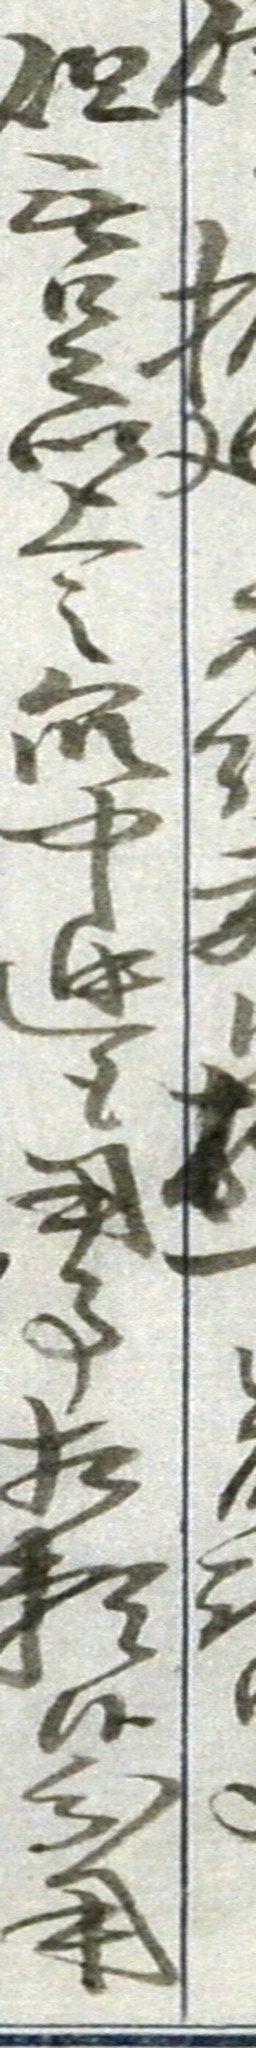但無足以上之衆中迚も用事相頼候分用
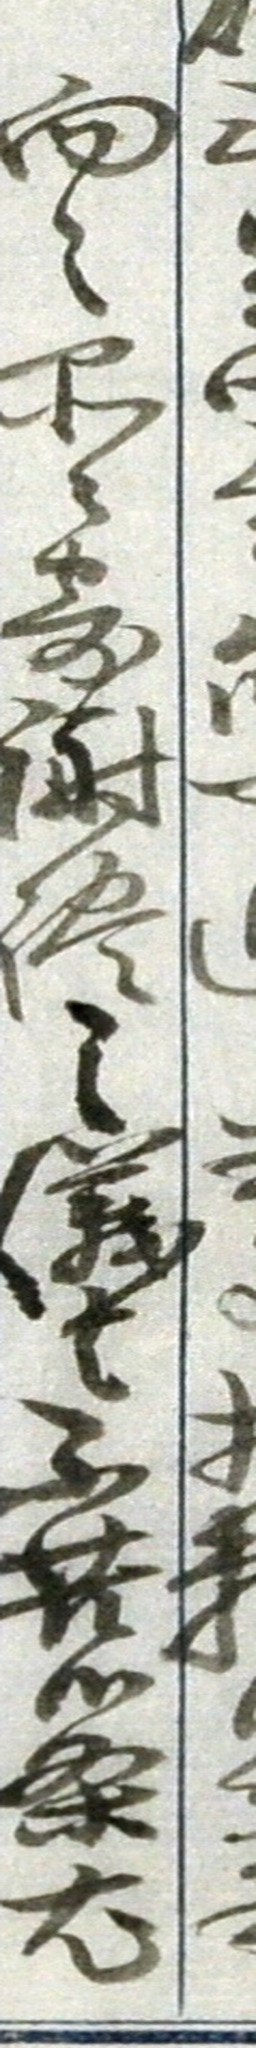向之品ニ寄謝礼之儀は不苦候条尤
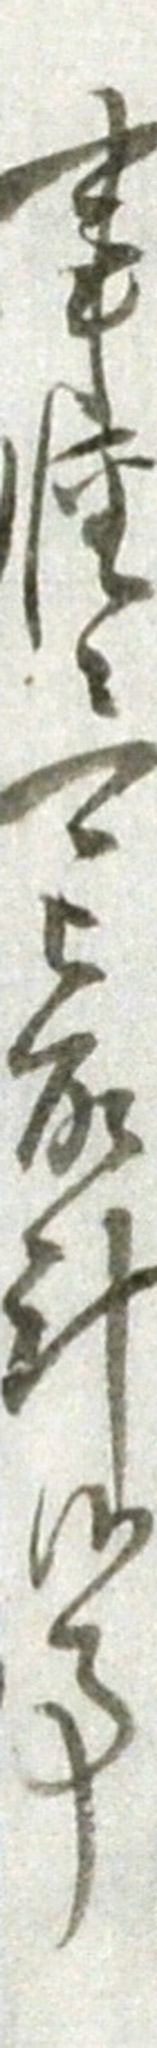事軽く可被取計候事
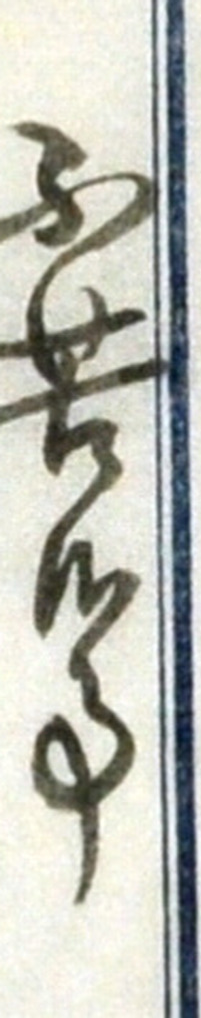不苦候事
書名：御倹約被仰出書
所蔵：伊那市立高遠町図書館・合同会社AMANE
